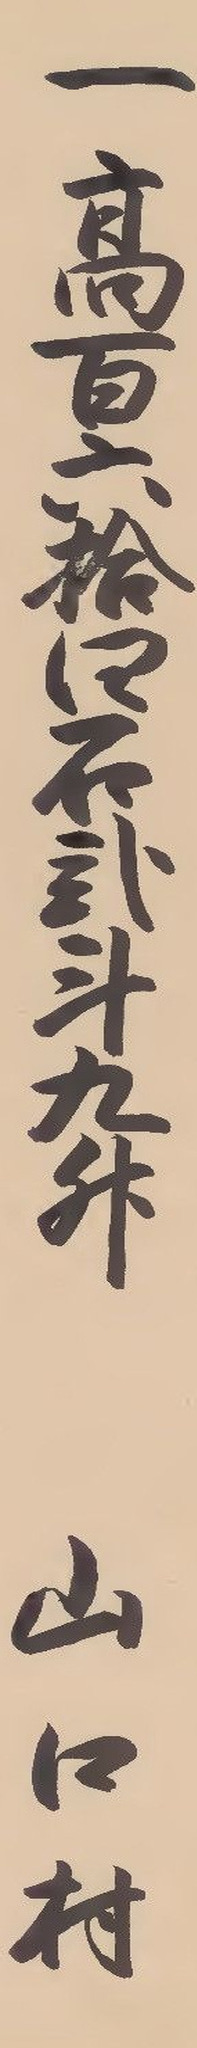一高百六拾四石弐斗九升山口村
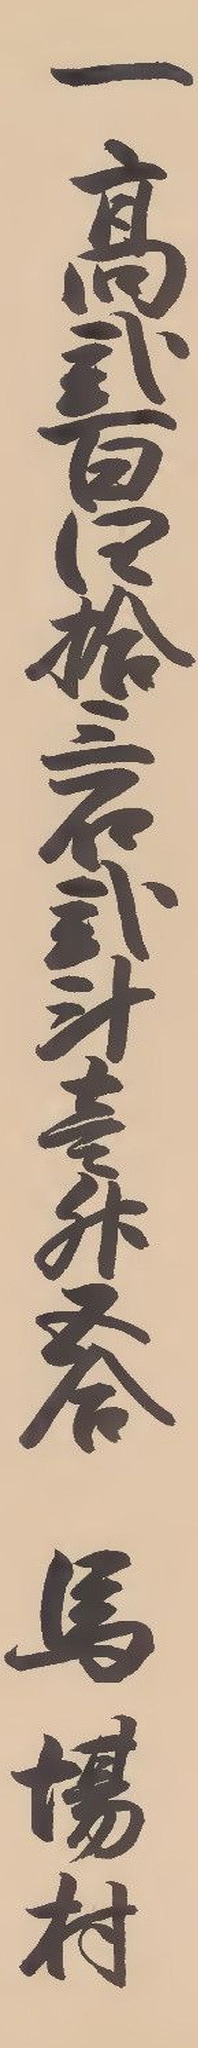一高弐百四拾三石弐斗壱升五合馬場村
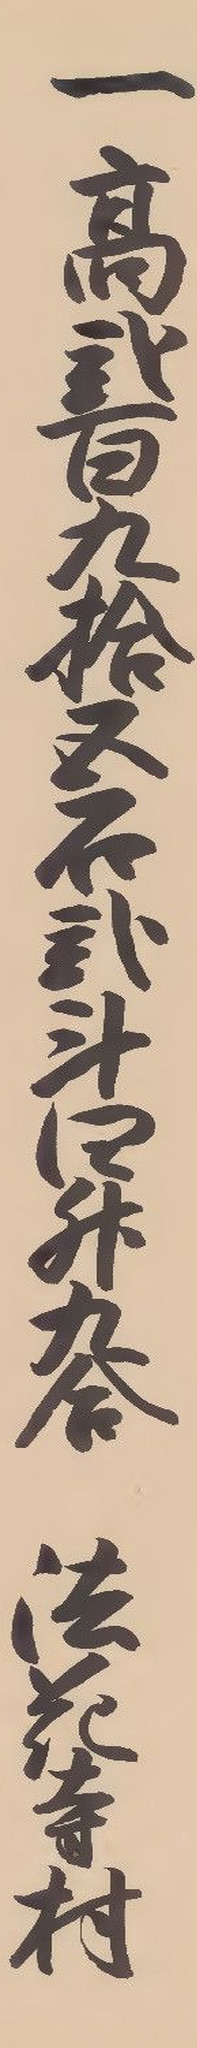一高弐百九拾五石弐斗四升九合法花寺村
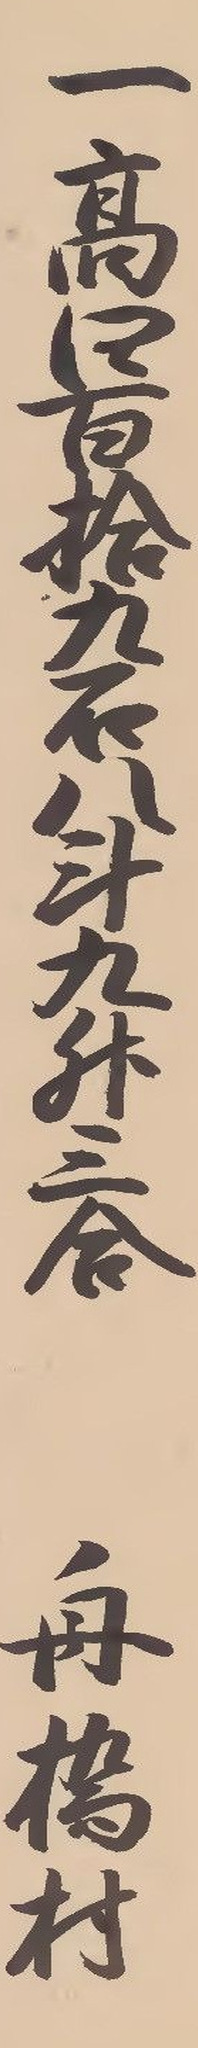一高四百拾九石八斗九升三合舟橋村
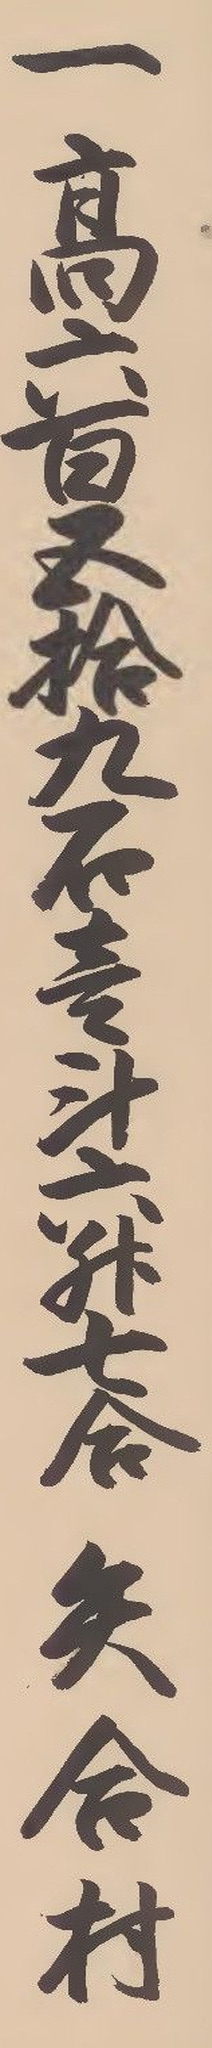一高六百五拾九石壱斗六升七合矢合村
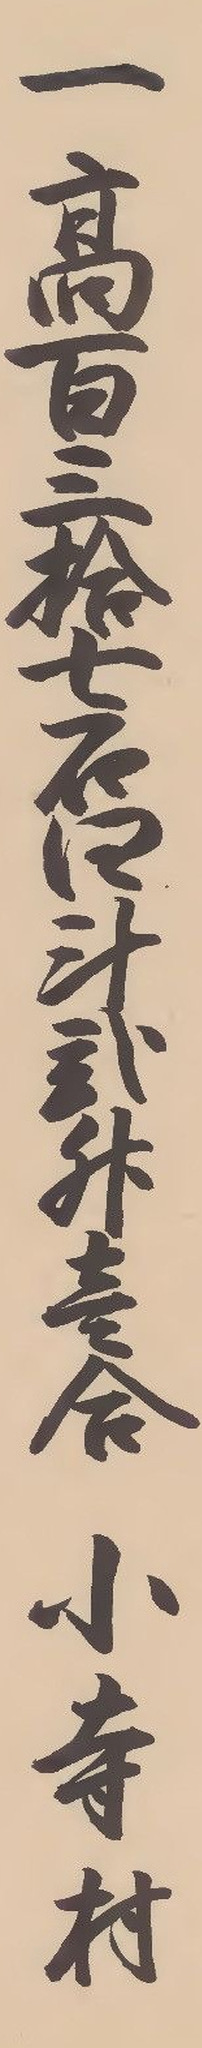一高百三拾七石四斗弐升壱合小寺村
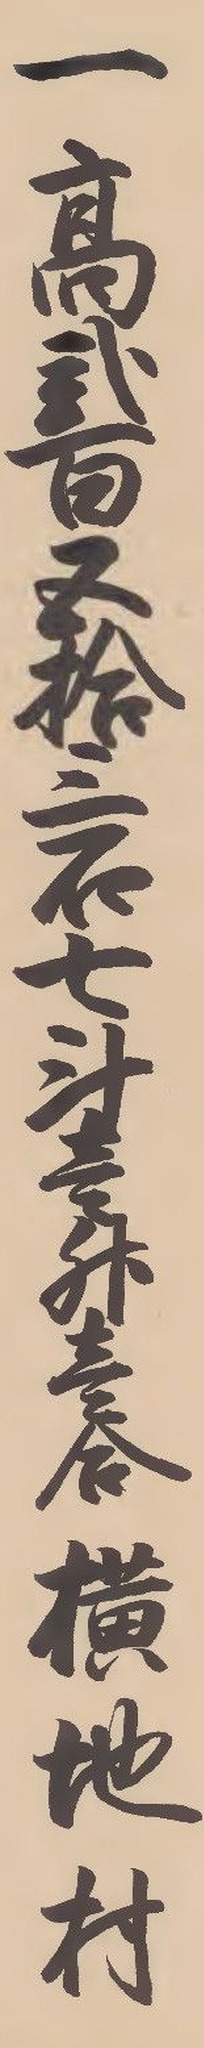一高弐百五拾三石七斗壱升壱合横地村
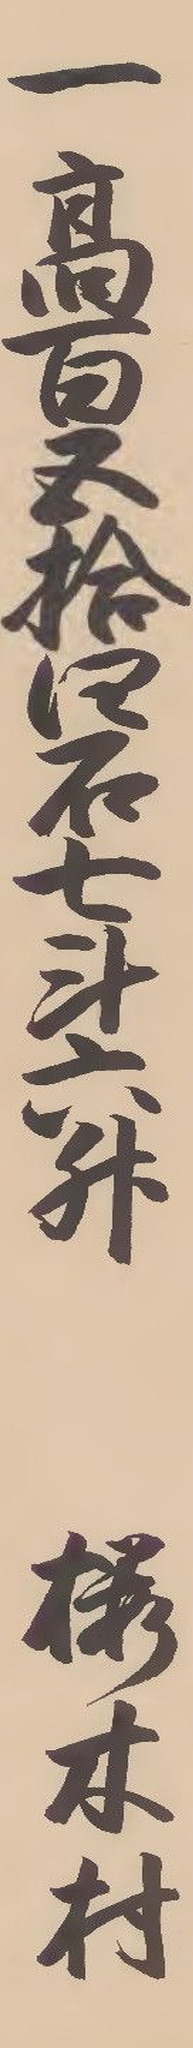一高百五拾四石七斗六升桜木村

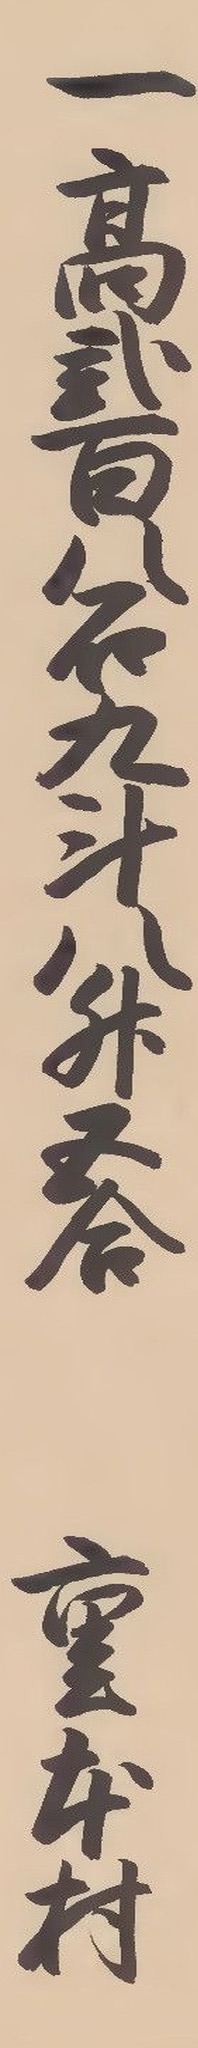一高弐百八石九斗八升五合重本村
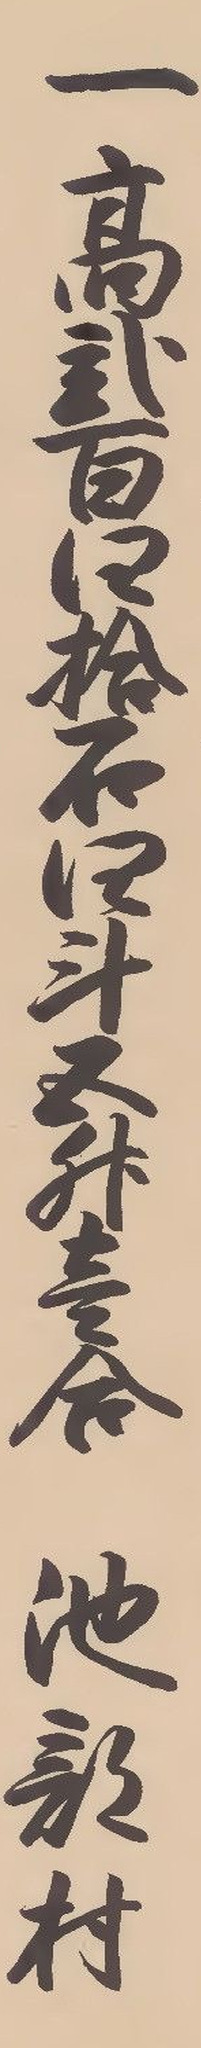一高弐百四拾石四斗五升壱合池部村
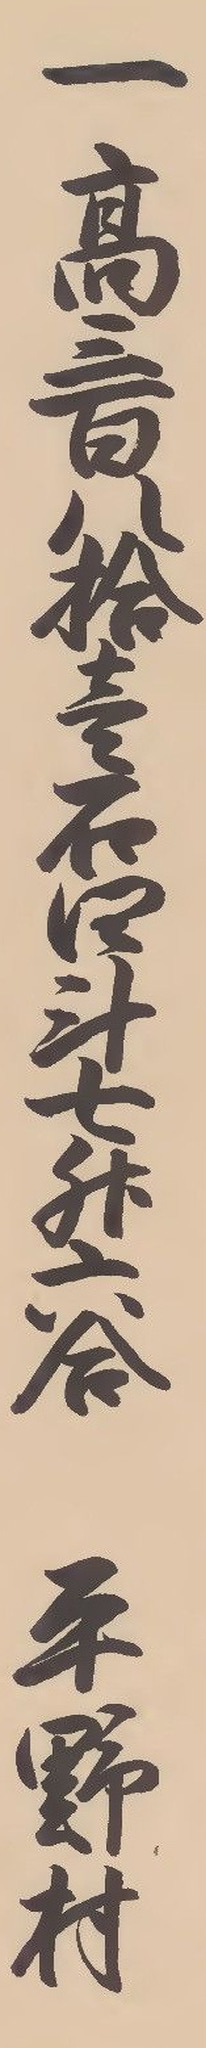一高三百八拾壱石四斗七升六合平野村
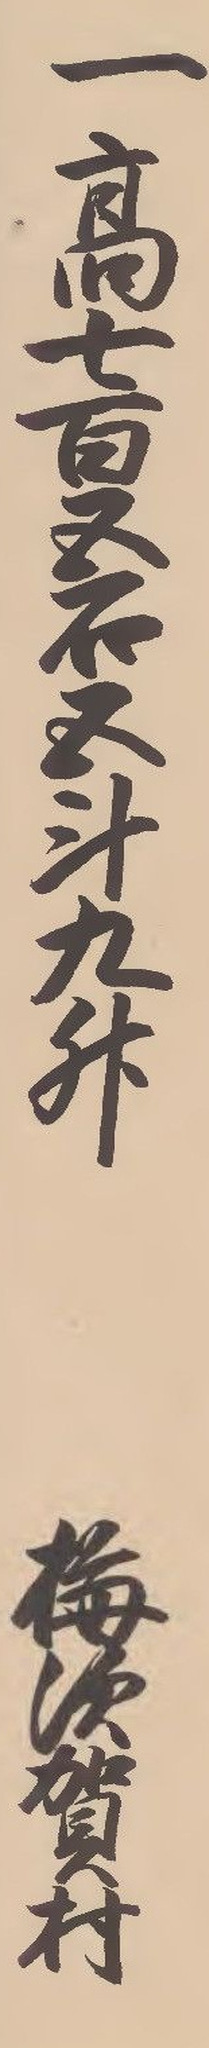一高七百五石五斗九升梅須賀村
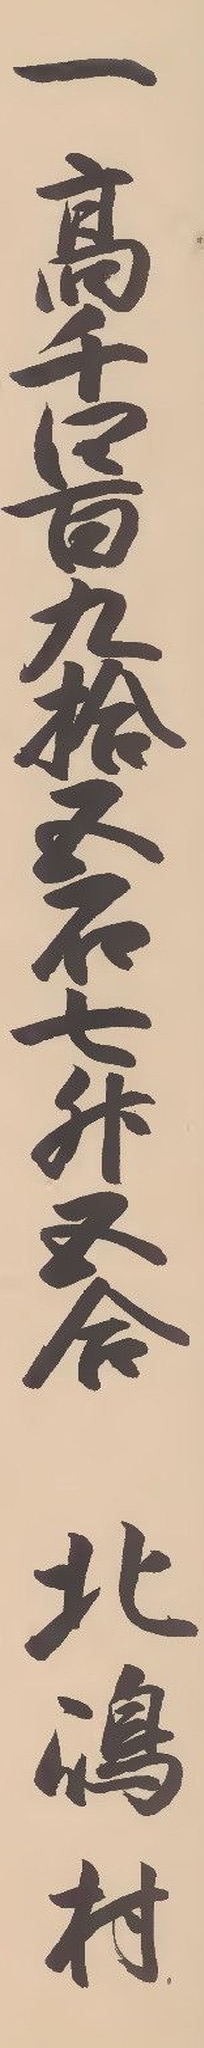一高千四百九拾五石七升五合北島村
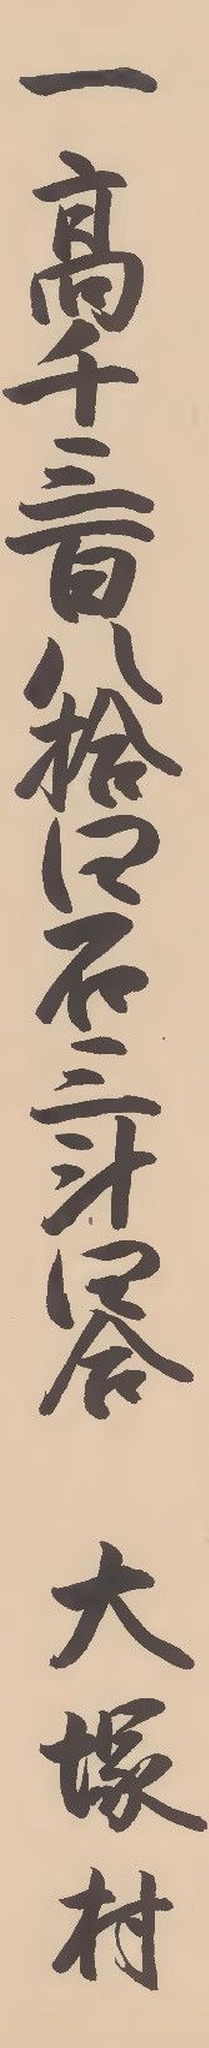一高千三百八拾四石三斗四合大塚村
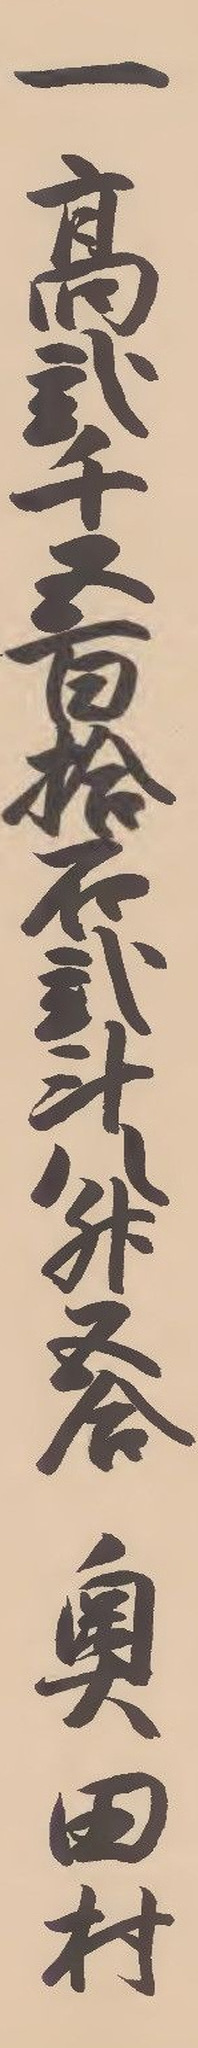一高弐千五百拾石弐斗八升五合奥田村
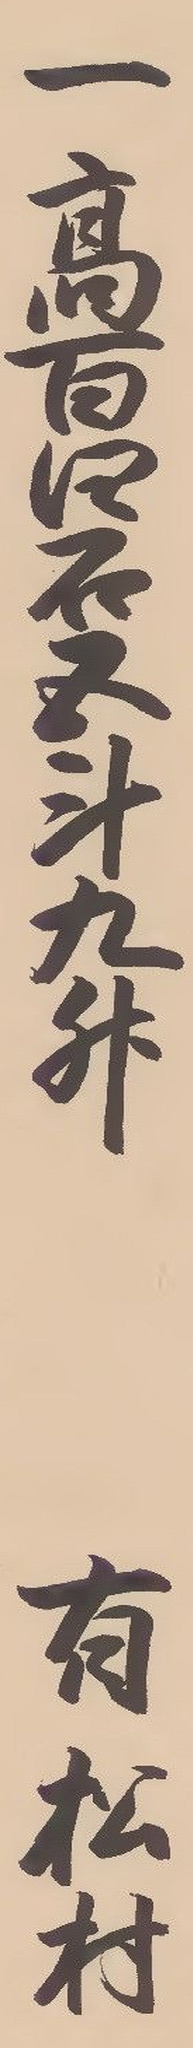一高百四石五斗九升有松村
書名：尾張国郷帳
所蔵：国立公文書館 National Archives of Japan
